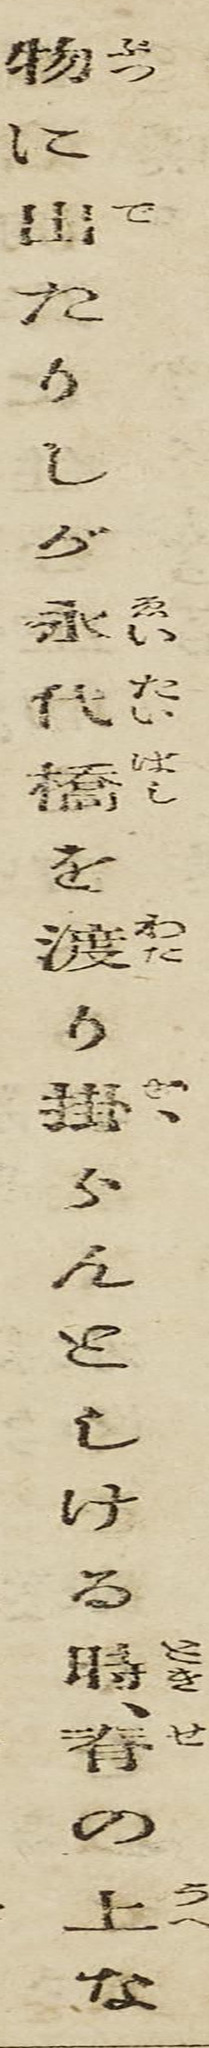物に出たりしが永代橋を渡り掛らんとしける時、脊の上な
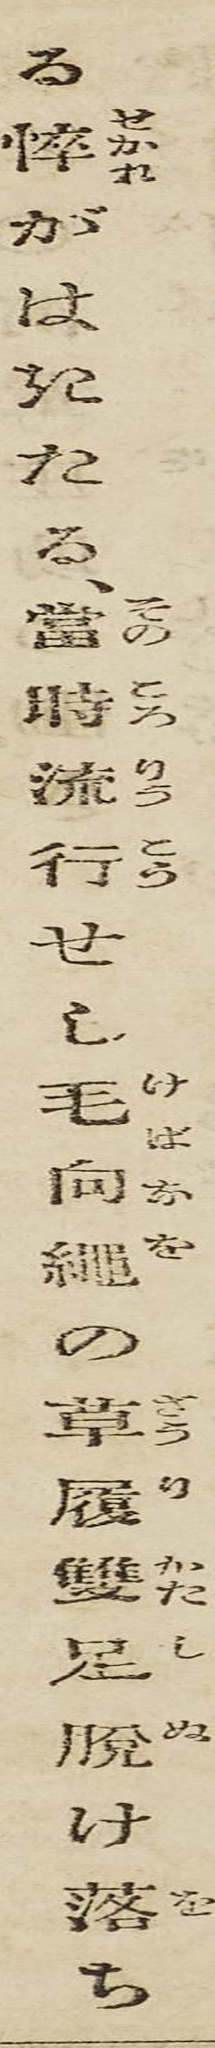る悴がはきたる、当時流行せし毛向縄の草履双足脱け落ち
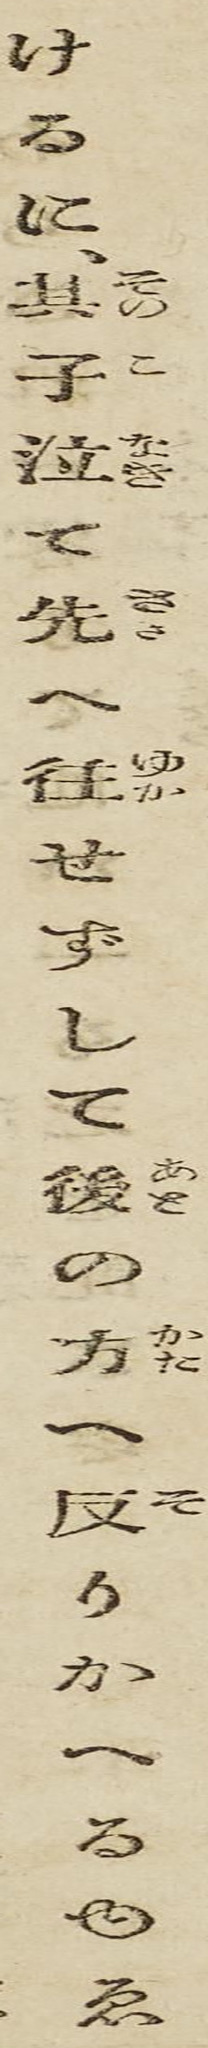けるに、其子泣て先へ往せずして後の方へ反りかへるゆゑ
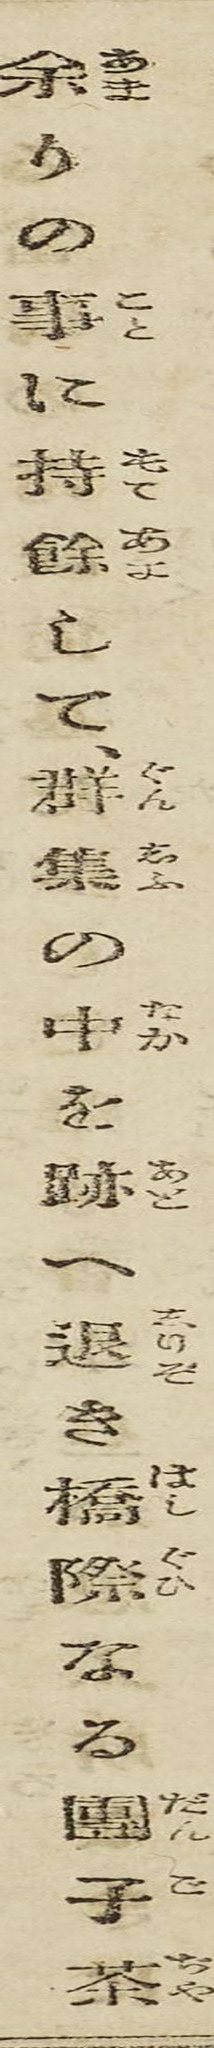余りの事に持余して、群衆の中を跡へ退き橋際なる団子茶
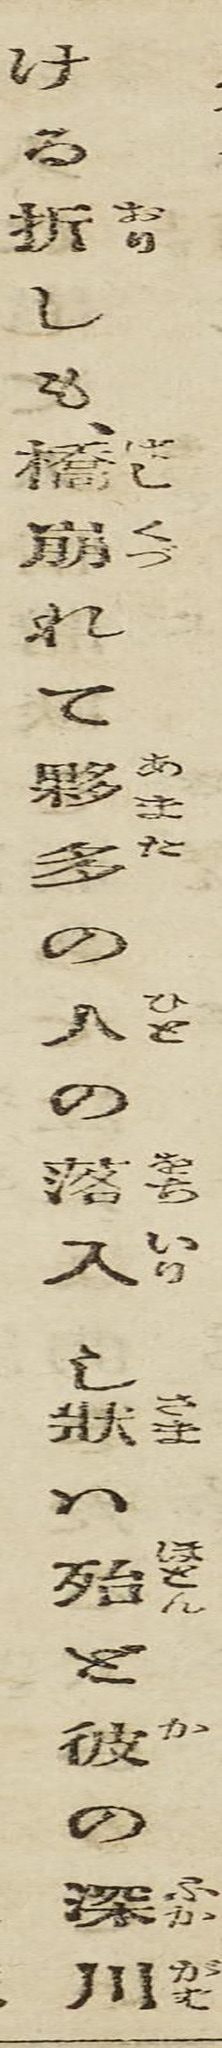ける折しも、橋崩れて夥多の人の落入し状は殆と彼の深川
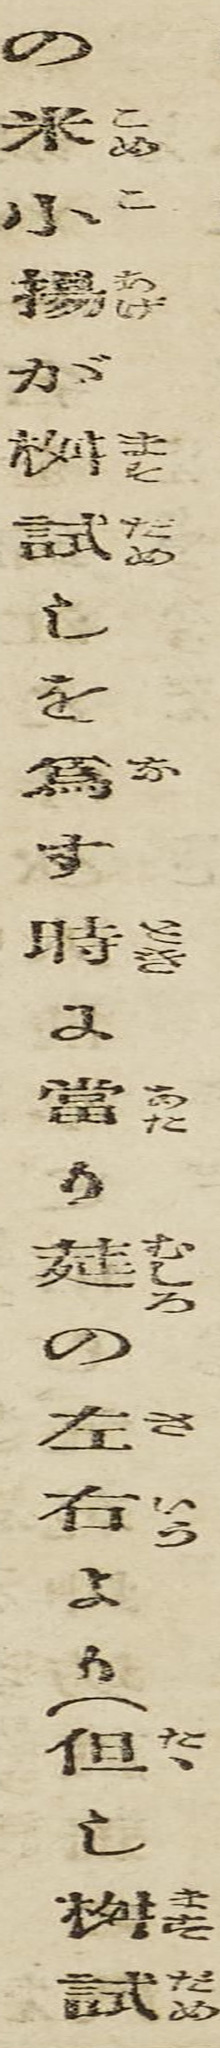の米小揚が舛試しを為す時に当り筵の左右よりし桝試
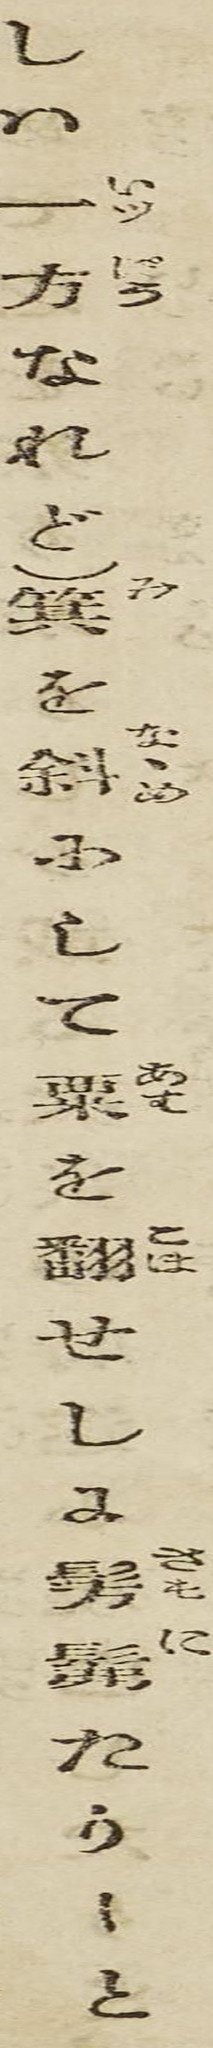しは一方なれど）箕を斜にして粟を翻せしに髣髴たりしと
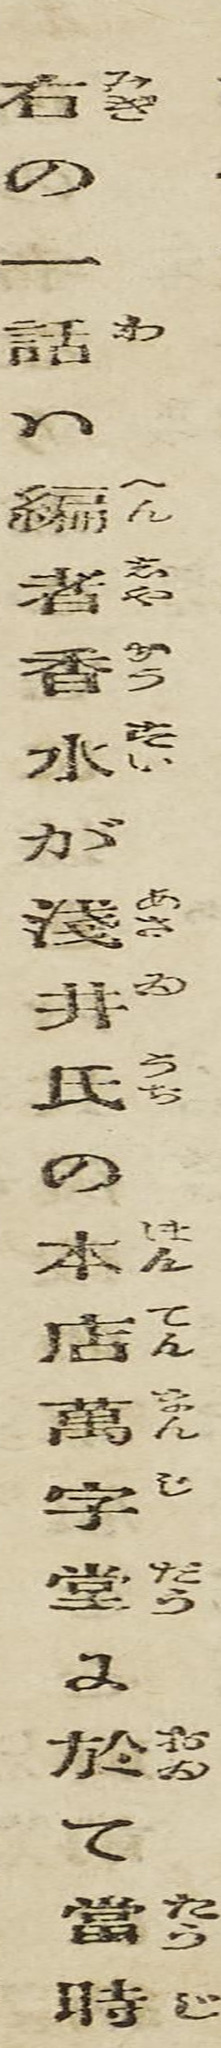右の一話は編者香水が浅井氏の本店萬字堂に於て当時
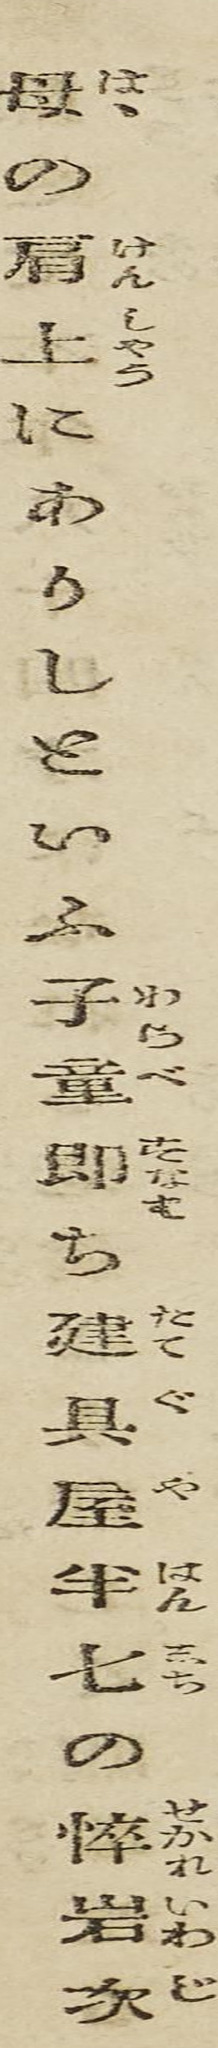母の肩上にありしといふ子童即ち建具屋半七の悴岩次

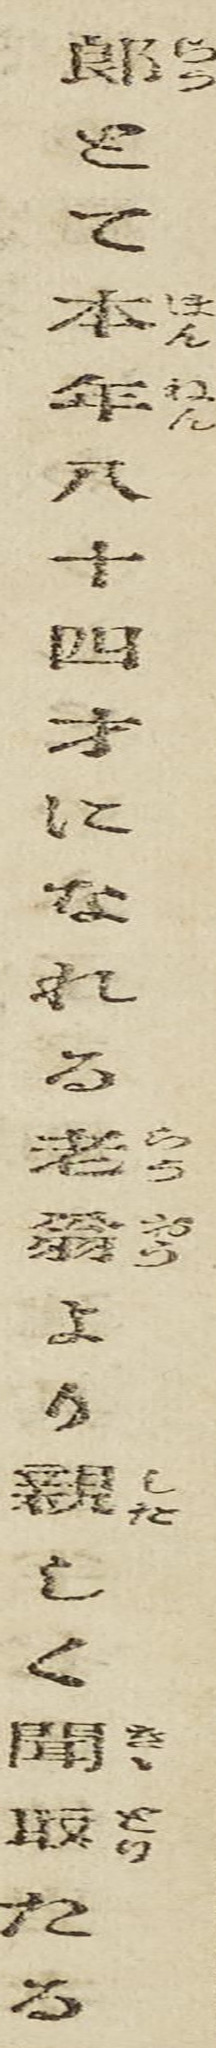郎とて本年八十四才になれる老翁より親しく聞取たる
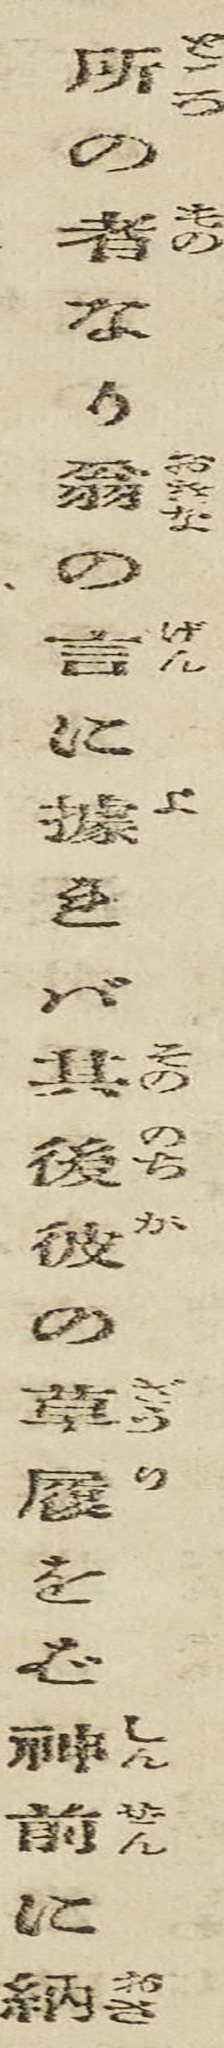所の者なり翁の言に拠れば其後彼の草履をば神前に納
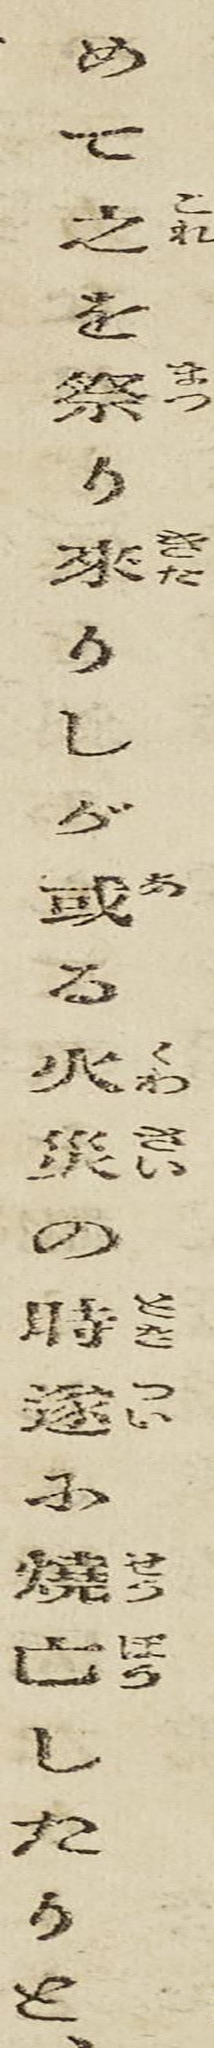めて之を祭り来りしが或る火災の時遂に焼亡したりと、
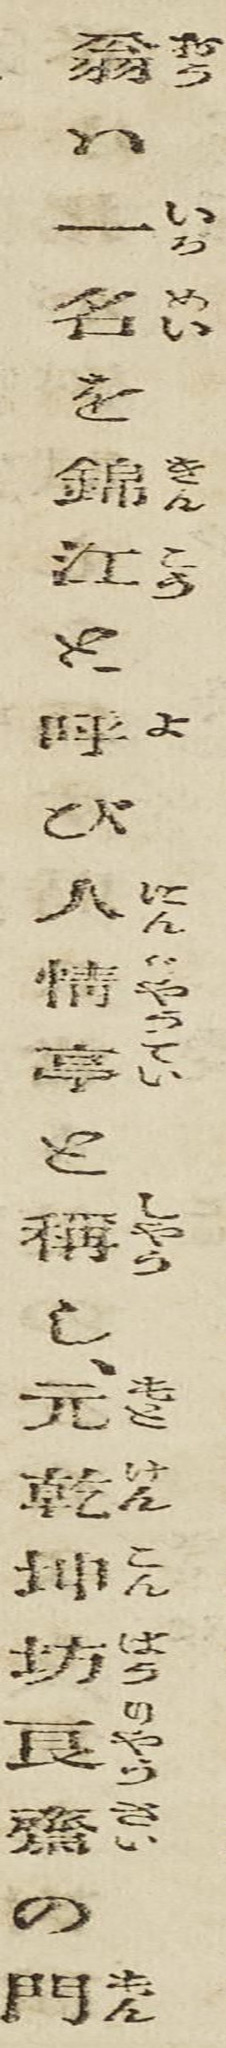翁は一名を錦江と呼び人情亭と称し、元乾坤坊良齋の門
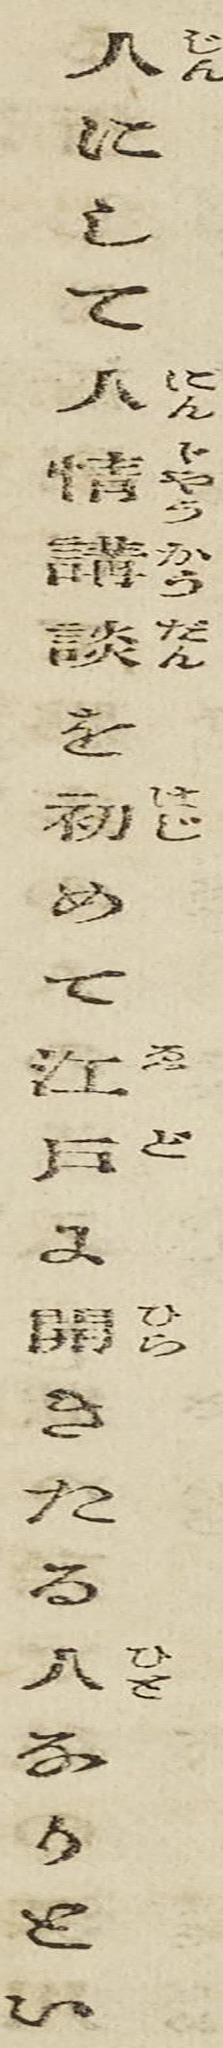人にして人情講談を初めて江戸に開きたる人なりとい
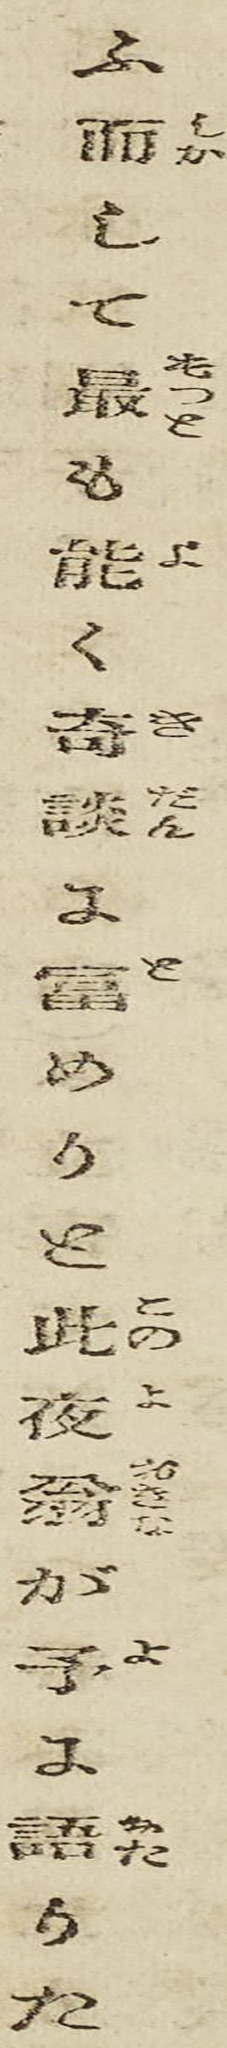ふ而して最も能く奇談に富めりと此夜翁が予に語りた
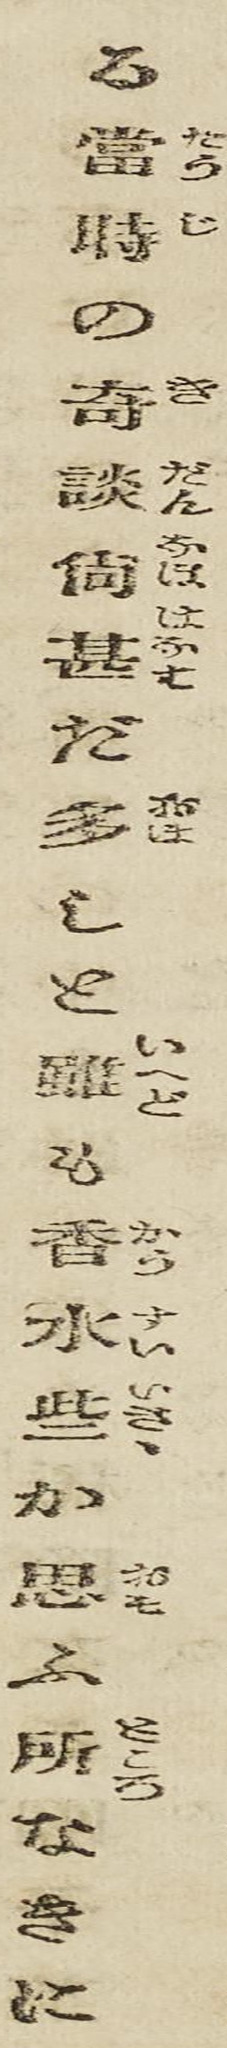る当時の奇談猶甚だ多しと雖も香水些か思ふ所なきに
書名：永代惨話　文化の夢　全
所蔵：東京大学地震研究所図書室 Earthquake Research Institute Library, The University of Tokyo, JAPAN
